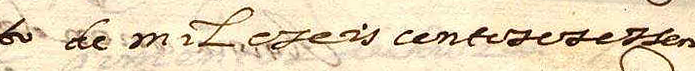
to de miL e seiscentos e sessen
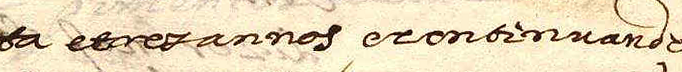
ta e tres annos, e continuando
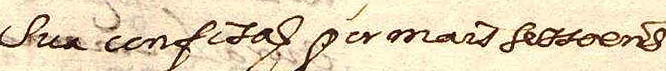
sua confisaõ per mais sessoen̄s
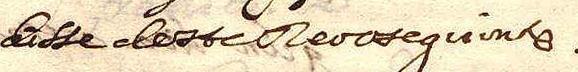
disse deste Reo o seguinte.
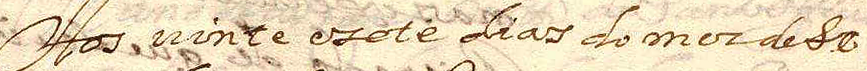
Aos uinte e sete dias do mez de se
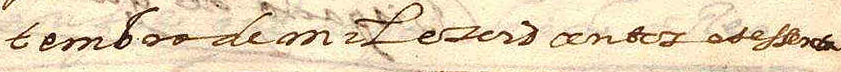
tembro de miL e seiscentos e sessenta
